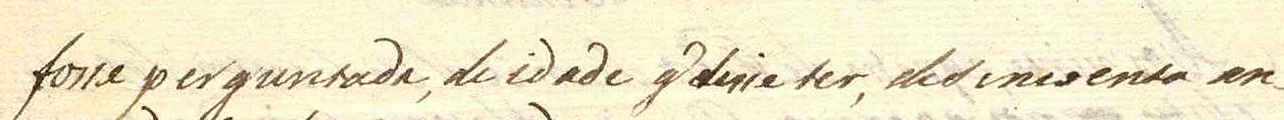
fosse perguntada, de idade q̄ disse ter, de sincoenta an
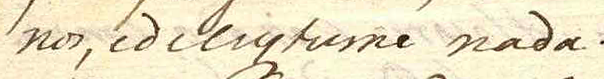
nos, e de custume nada.
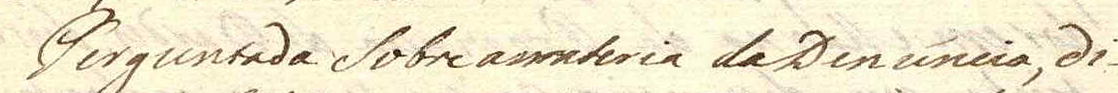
Perguntada sobre a materia da Denuncia, di
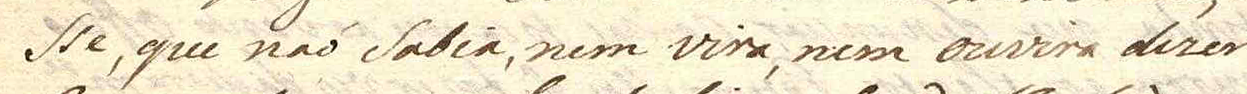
sse, que naõ sabia, nem vira nem ouvira dizer
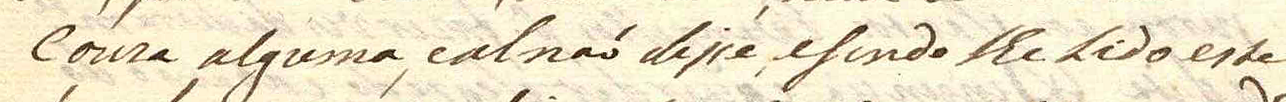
Couza alguma, e al naõ disse, e sendo lhe Lido este
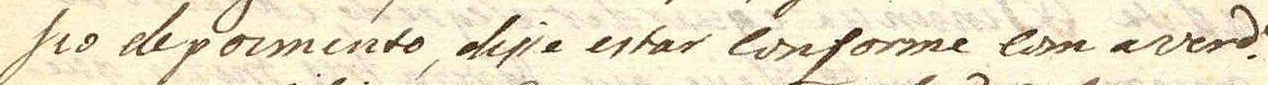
seo depoimento, disse estar conforme com a verd.e
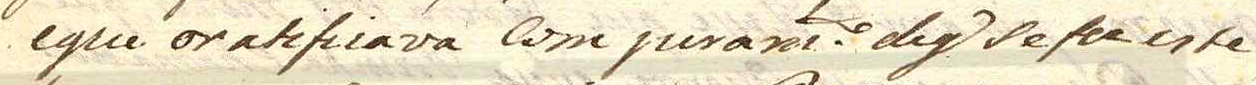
e que o ratificava com juram.to de q̄ se fes este
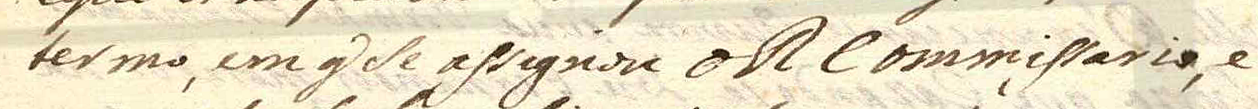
termo, em q̄ se assignou o R Commissario, e
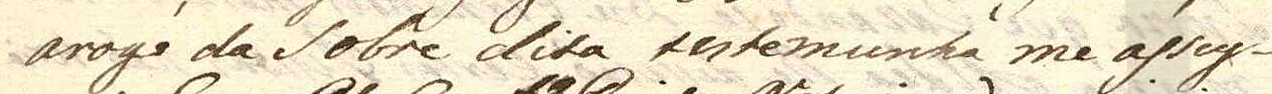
a rogo da sobredita testemunha me asseg
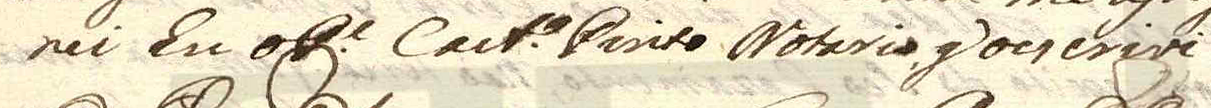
nei Eu o P.e Caet.o Pinto Notario, q̄ o escrevi
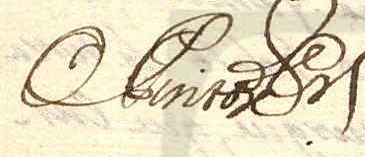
O Pinto xer
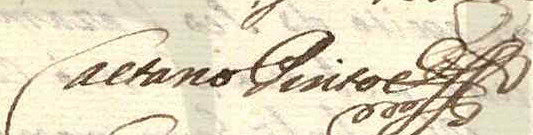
Caetano Pinto
